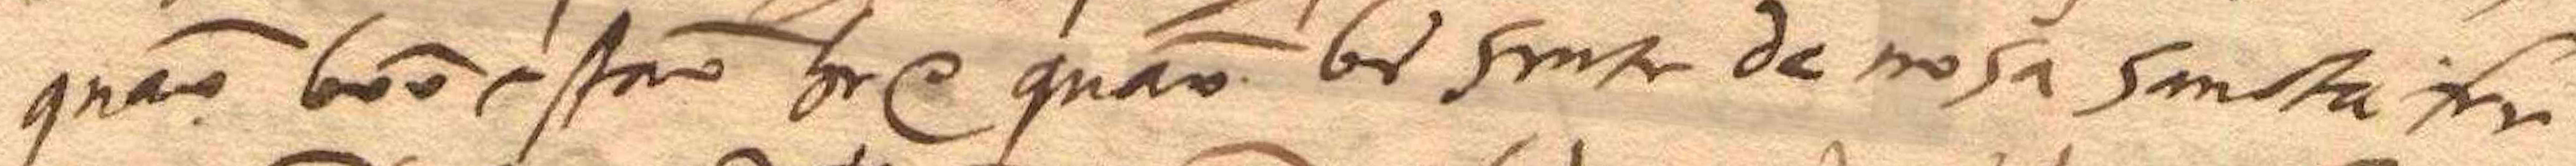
quão boō cistão he e quão bē sente de nosa Sancta fee
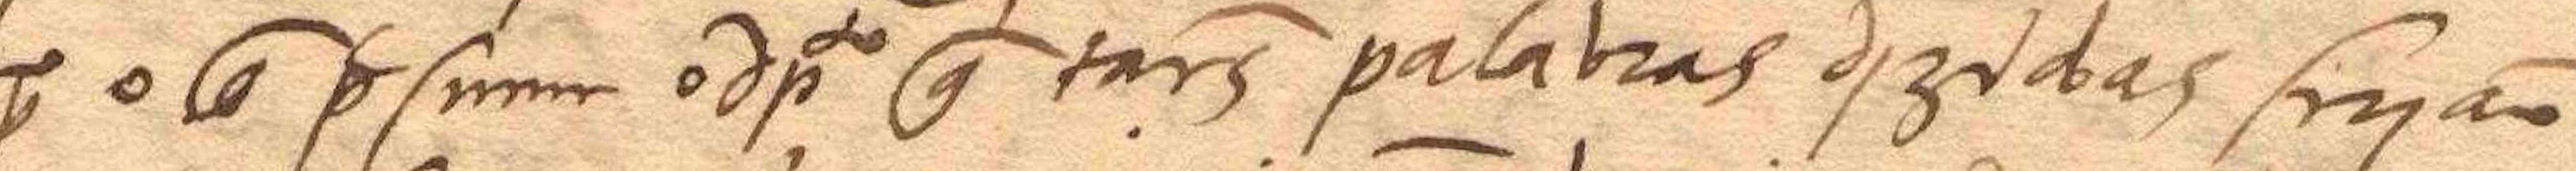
p̄o o q̄ p̄sume o drto q̄ taēs palavras djzēdoas serjão
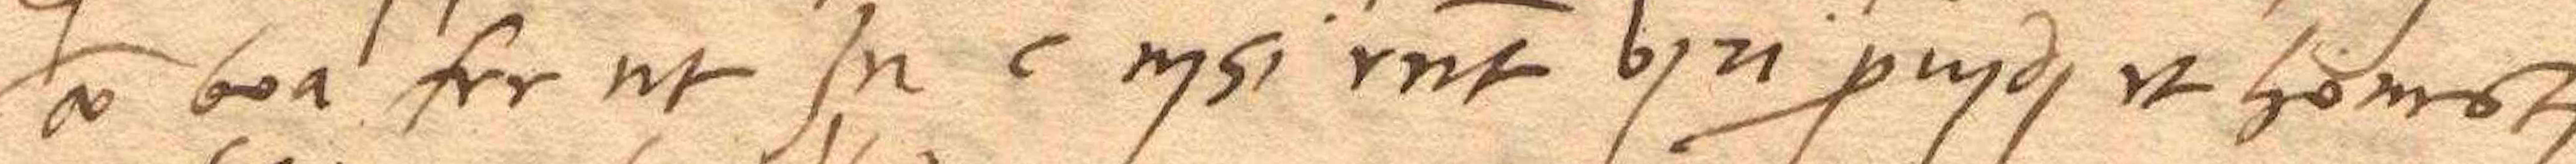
c̄o boa fee ut Jn c njsi erīt vjri ꝓujdj et honestj
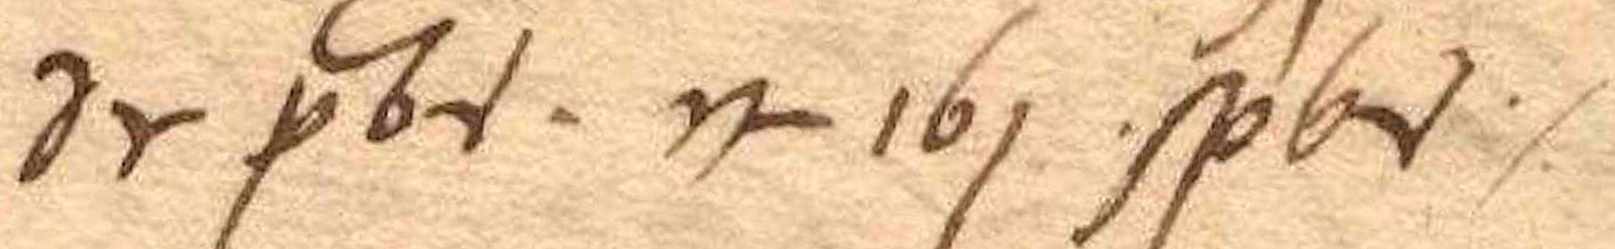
de p̄be. et ibj spibē ./
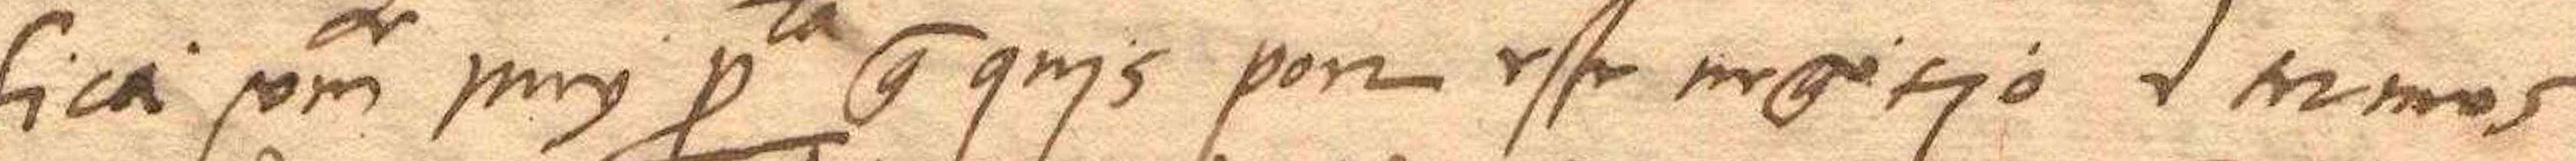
fica somte ruy ꝑra q̄ qujs poer este negotjo ē termos
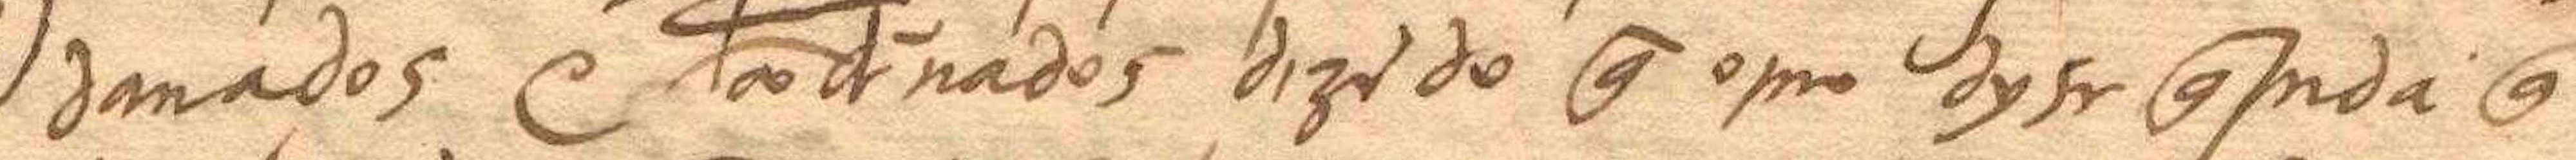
danados e c̄odēnados dizēdo q̄ o reo dyse q̄ Jnda q̄
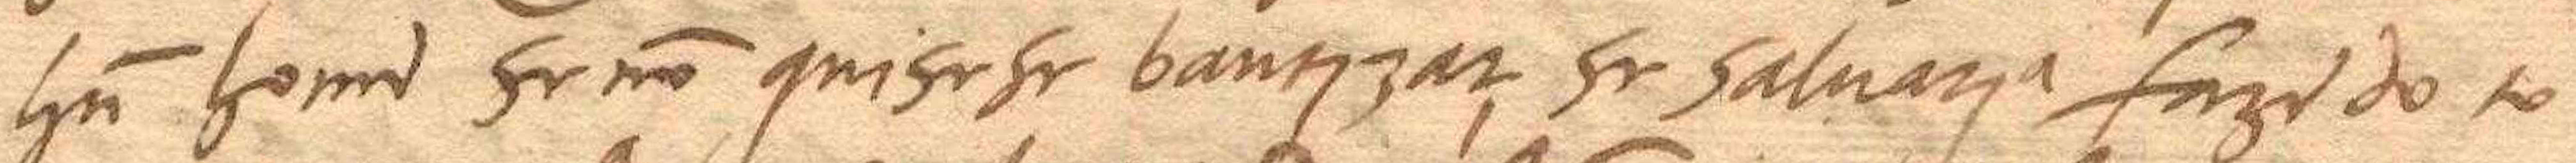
hū homē Se nō quiseSe bautjzar Se Saluarja fazēdo to
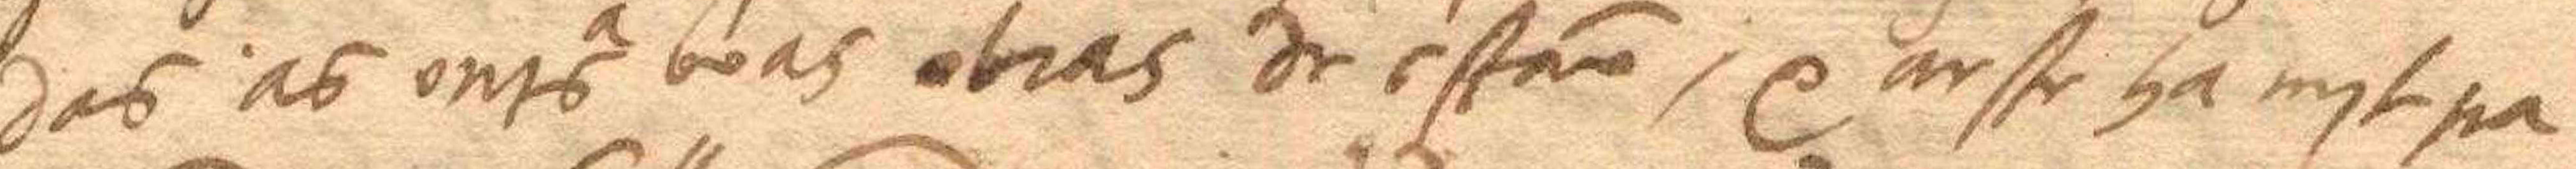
das as outsa boas obras de cistão / e a este ha mjl ra
